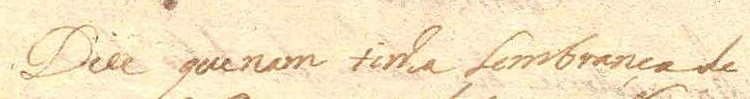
Dice que nam tinha lembrança de
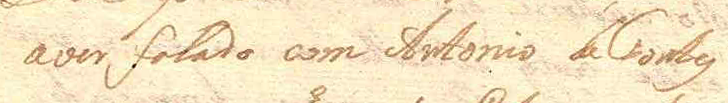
aver falado com Antonio de Fontes
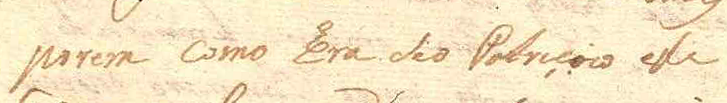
porem como Era seo Patriçoio elle
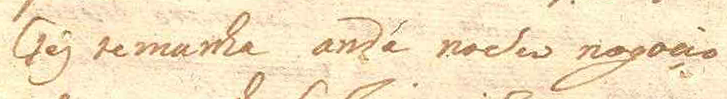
Testemunha anda no seo nogocio
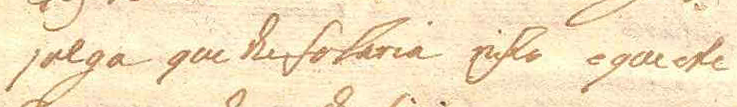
julga que lhe falaria nisso o que elle
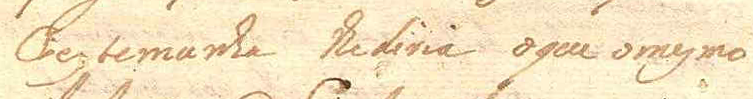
Testemunha lhe diria o que o mesmo
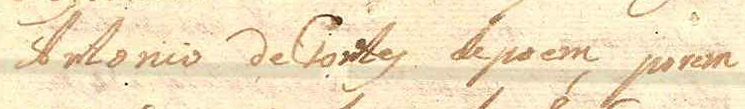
Antonio de Fontes depoem porem
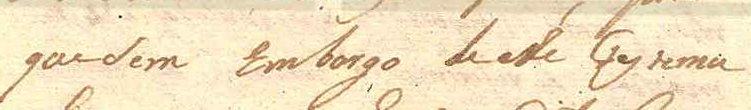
que sem Embargo de elle Testemu
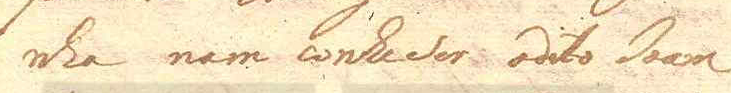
nha nam conheser o dito Ioam
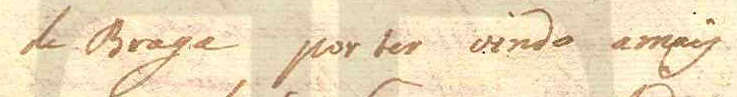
de Braga por ter vindo a mais
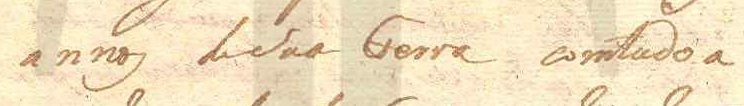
annos de Sua Terra, comtudo a
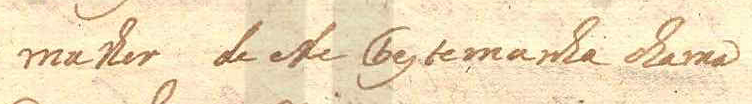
mulher de elle Testemunha chama
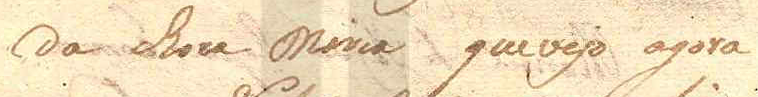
da Roza Maria que vejo agora
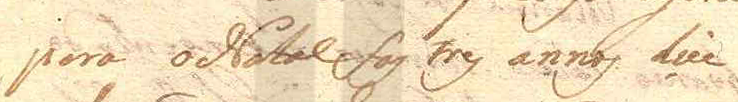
para o Natal fas tres annos dice
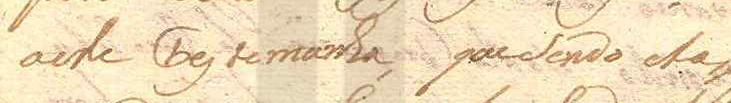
a ele Testemunha, que sendo ela
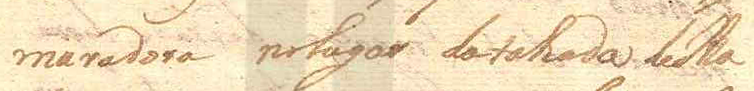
moradora no Lugar da talhada de Ilha
